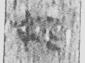七十=
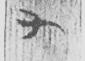九
